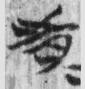之月
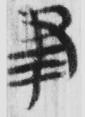○（盡）
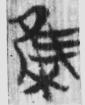集
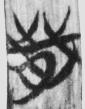歲（歲）
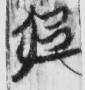竆（躬）
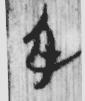身
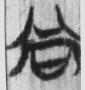尚
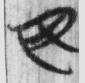母
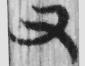又（有）
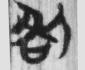咎
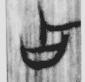占
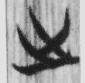之
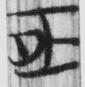亙（恆）
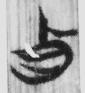貞
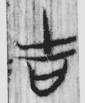吉
